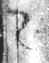乙
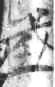帝
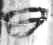㠯（以）
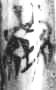嗌（益）
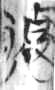淒
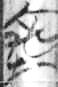堣（禹）
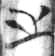之
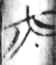火
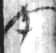午
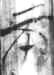不
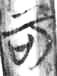可
